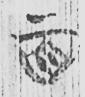百
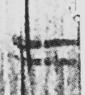二
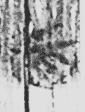百
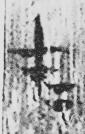七十=
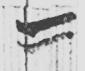二
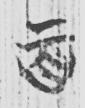百
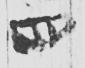四
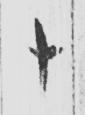十
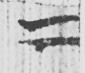二
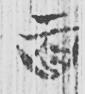百
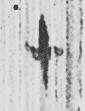十
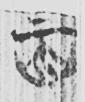百
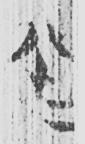八十=
